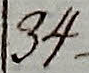34
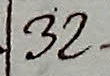32
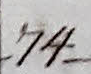74
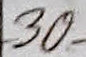30
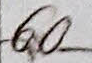60
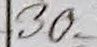30
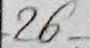26
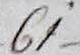61
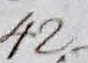42
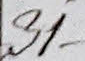31
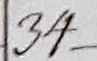34
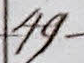49
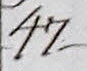47
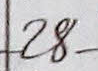28
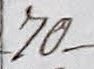70
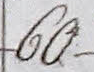60
